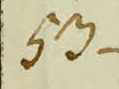53
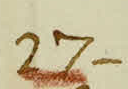27
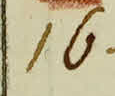16
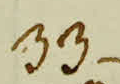33
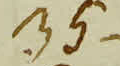35
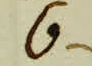6
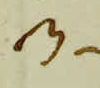3
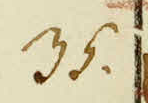35.
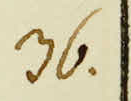36.
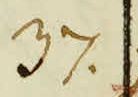37.
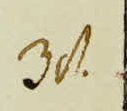38.
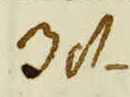38
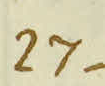27
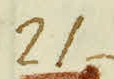21
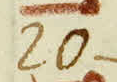20
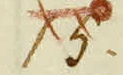15
